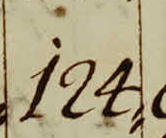124
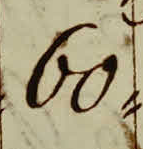60
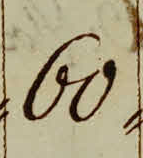60
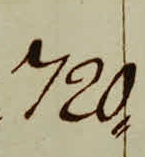720
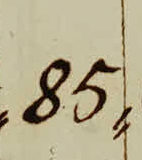85
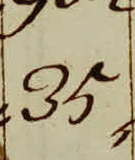35
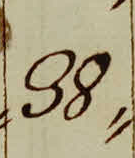38
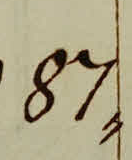87
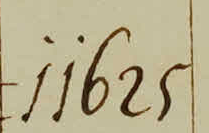11625
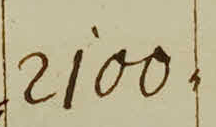2100
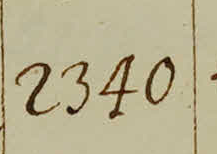2340
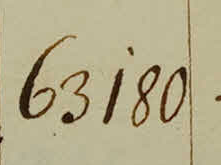63180
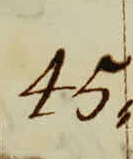45
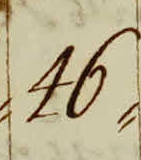46
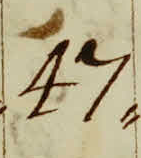47
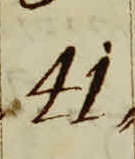41
